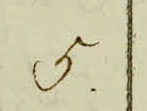5.
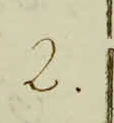2.
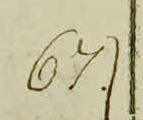67.
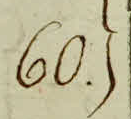60.
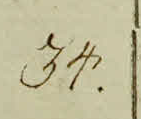34.
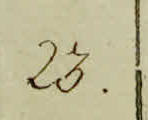23.
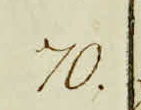70.
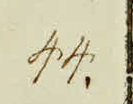44.
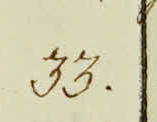33.
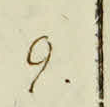9.
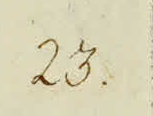23.
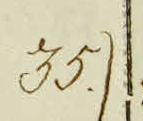35.
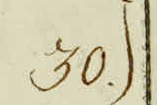30.
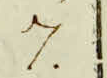7.
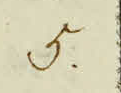5.
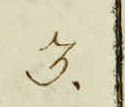3.
